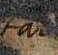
ta
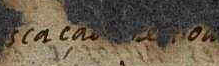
scaçaõ _e_ _o
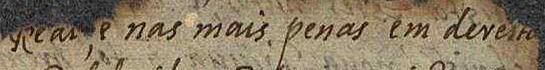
Real, e nas mais penas em dereito
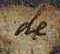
de
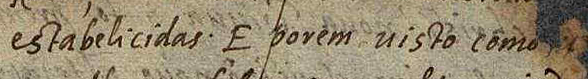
estabelicidas. E porem uisto como
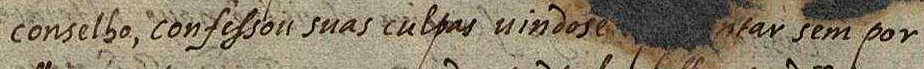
conselho, confessou suas culpas uindose _ntar sem por
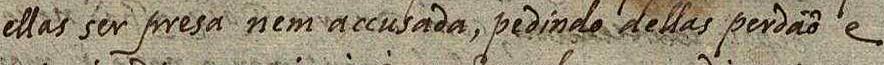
ellas ser presa nem accusada, pedindo dellas perdão e
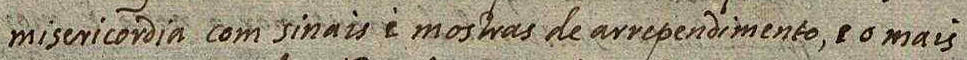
misericordia com sinais e mostras de arrependimento, e o mais
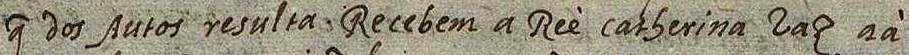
q̄ dos Autos resulta. Recebem a Ree catherina Vaz aà
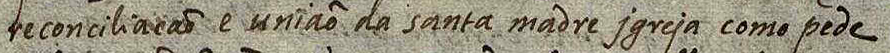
reconciliaçaõ e uniaõ da santa madre jgreja como pede
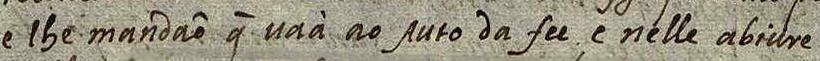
e lhe mandaõ q̄ uaá ao Auto da fee, e nelle abiure
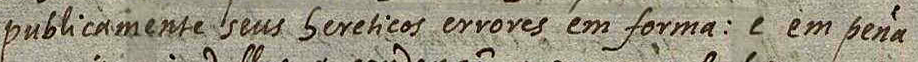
publicamente seus hereticos errores em forma: e em pen̄a
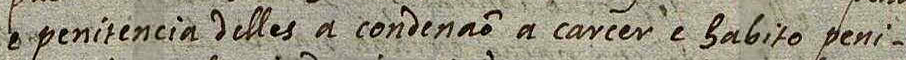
e penitencia delles a condenaõ a carcer e habito peni
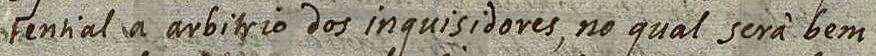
tensial a arbitrio dos inquisidores, no qual serà bem
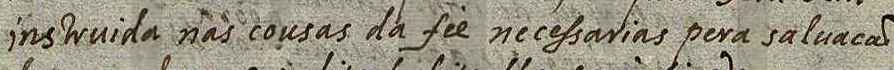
instruida nas cousas da fee necessarias pera saluaçaõ
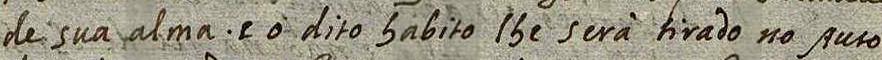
de sua alma. e o dito habito lhe será tirado no Auto
